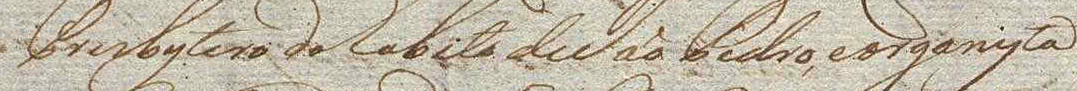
Presbytero do habito de Saõ Pedro, e organista
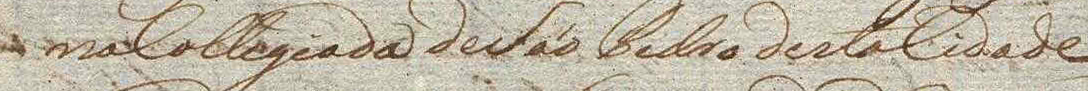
na Collegiada de São Pedro desta Cidade
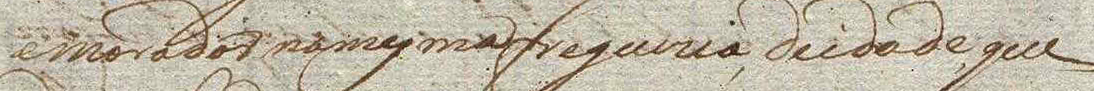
e morador na mesma freguezia, de idade que
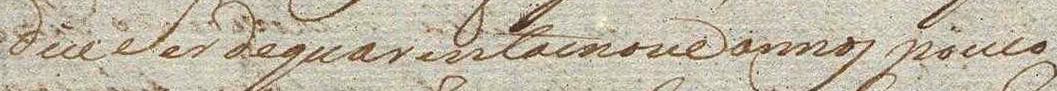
dice Ser de quarenta e nove annos pouco
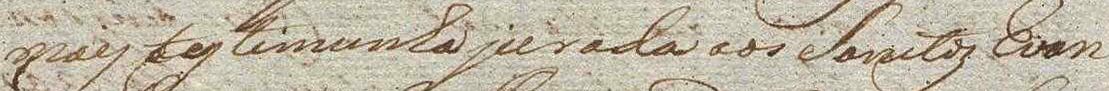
mais testimunha jurada aos Sanctos Evan
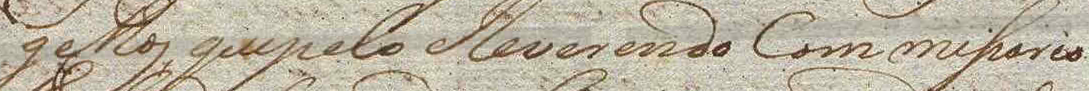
gelhos que pelo Reverendo Commissario
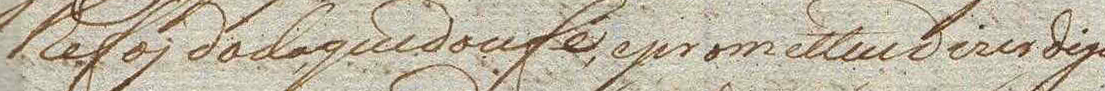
lhe foj dado, que dou fé, e prometteu dizer digo
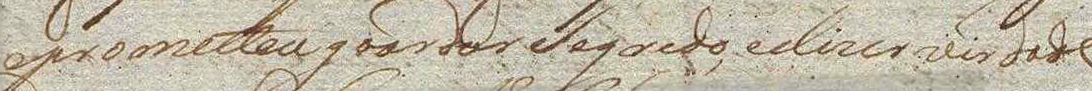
e prometteu goardar Segredo, e dizer virdade
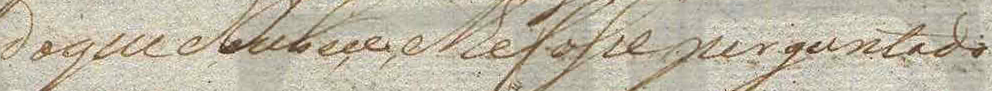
do que Soubeçe, e lhe fosse perguntado.
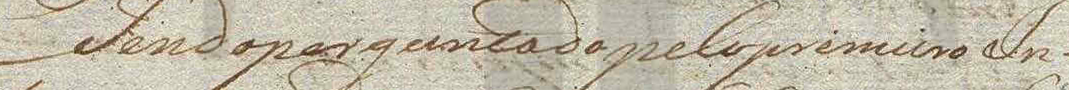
E Sendo perguntado pelo primeiro In
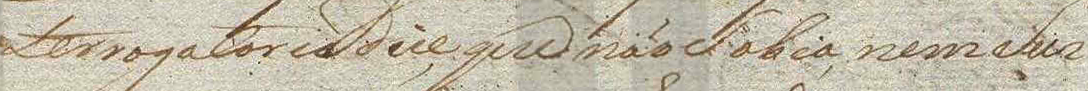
terrogatorio dice, que naõ Sabia, nem Sus
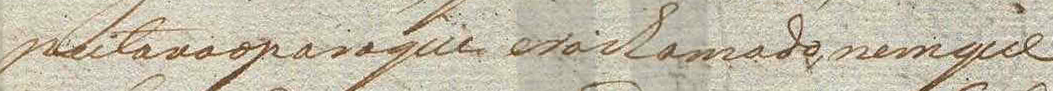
peitava o para que era chamado, nem que
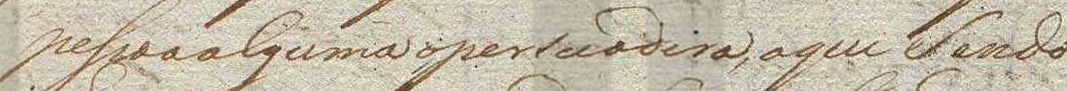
pessoa alguma o persuadira, a que Sendo
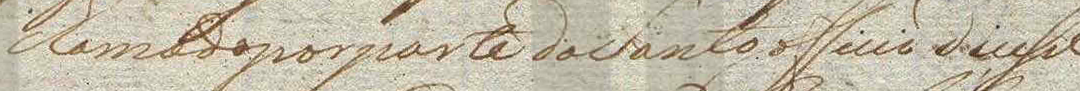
chamado por parte do Santo officio dicesse
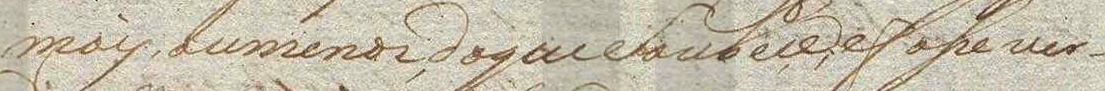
mais, ou menos, do que Soubeçe, e fosse ver
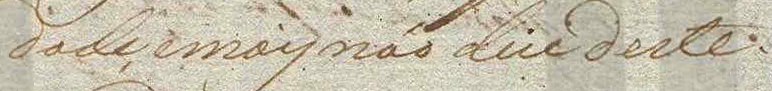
dade, e mais não dice deste.
